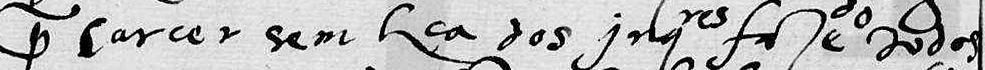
p̄o carcer sem Lça dos jnqres faZedo todos
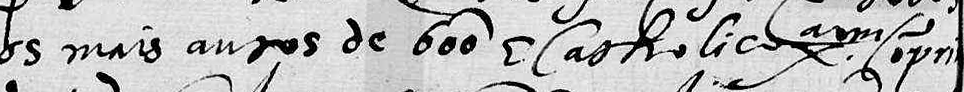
os mais autos de boō E Catholico Xam Cōpri
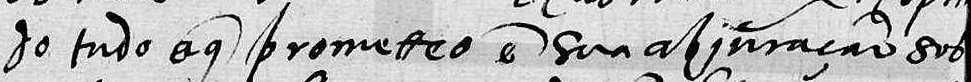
do tudo o q̄ prometteo ē sua abjuração sob
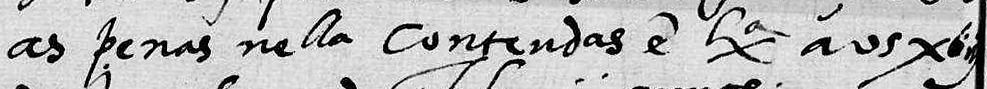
as penas nella conteudas ē Lxa aos xbiij
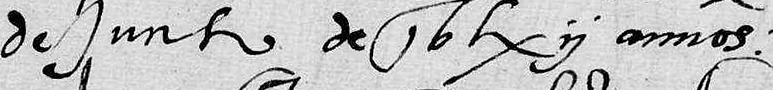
de Junho de j̄ blxij annos:
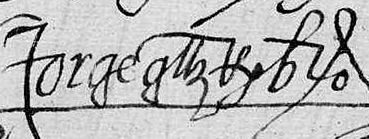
Jorge gllz̄ Rybro
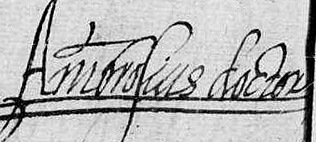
Ambrosius doctor
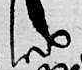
Ldo
